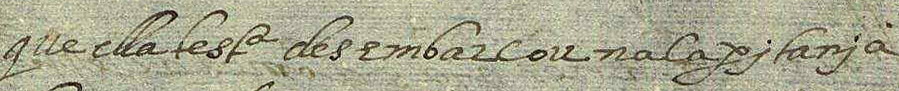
que ella testa desEmbarcou na Capjtanja
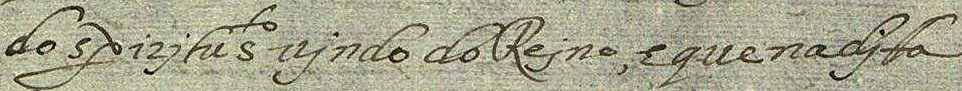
do spirjtu sto ujndo do Rejno, E que na djtta
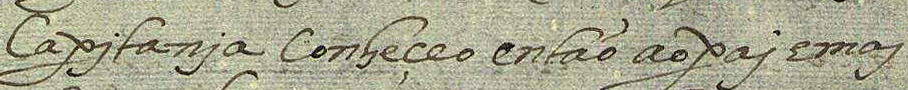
Capjtanja Conheçeo entaõ ao paj E maj
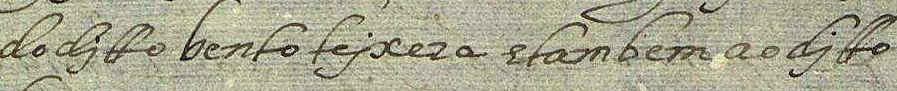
do djtto bento tejxera E tambem ao djtto
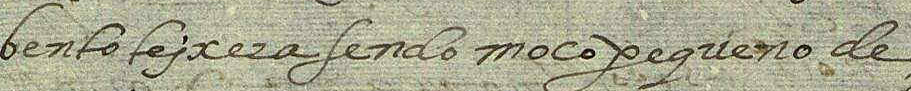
bento tejxera sendo moco pequeno de
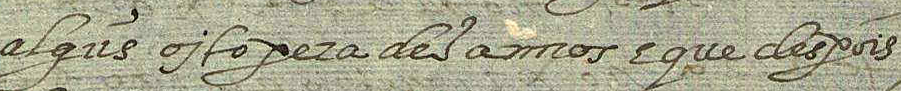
algūs ojto pera dez annos E que despoīs
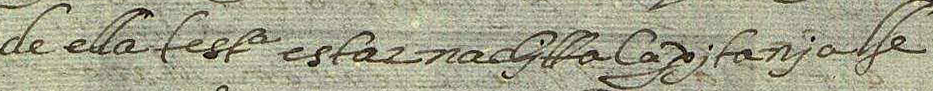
de ella testa estar na djtta Capjtanja lhe
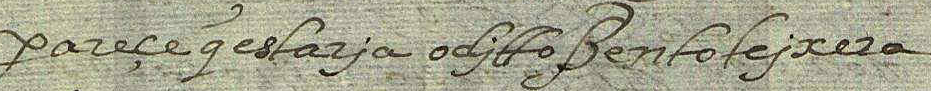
pareçe q̄ estarja o djtto Bento tejxera
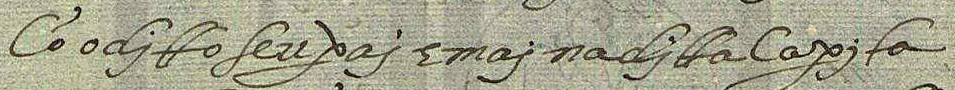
Cō o djtto seu paj E maj na djtta Capjta
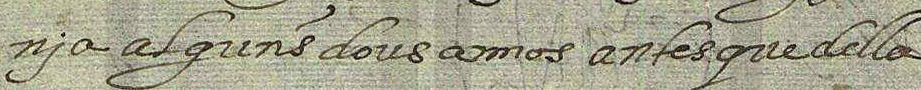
nja alguns dous anos antes que della
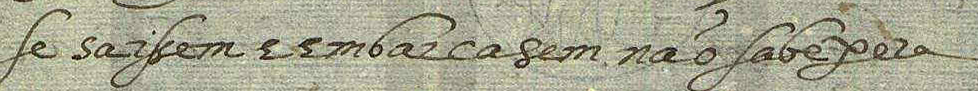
se saissem E Embarcassem naõ sabe pera
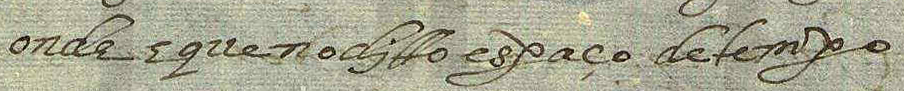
onde E que no djtto espaço de tempo
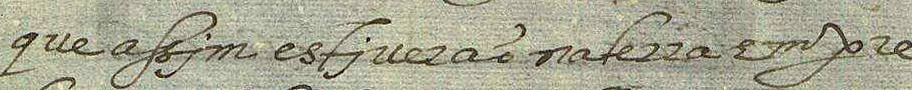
que assjm estjueraõ na terra Em pre
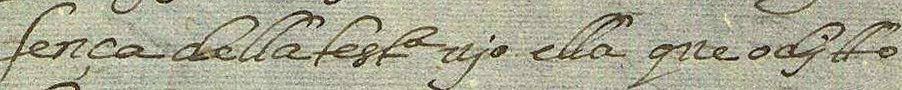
sença della testa ujo ella que o djtto
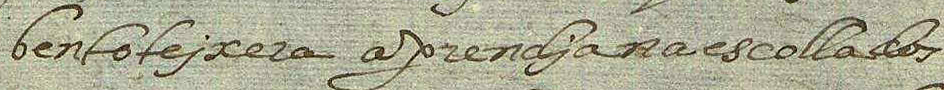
bento tejxera aprendja na escolla dos
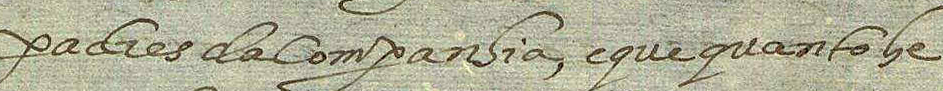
padres da Companhia, e que quanto he
